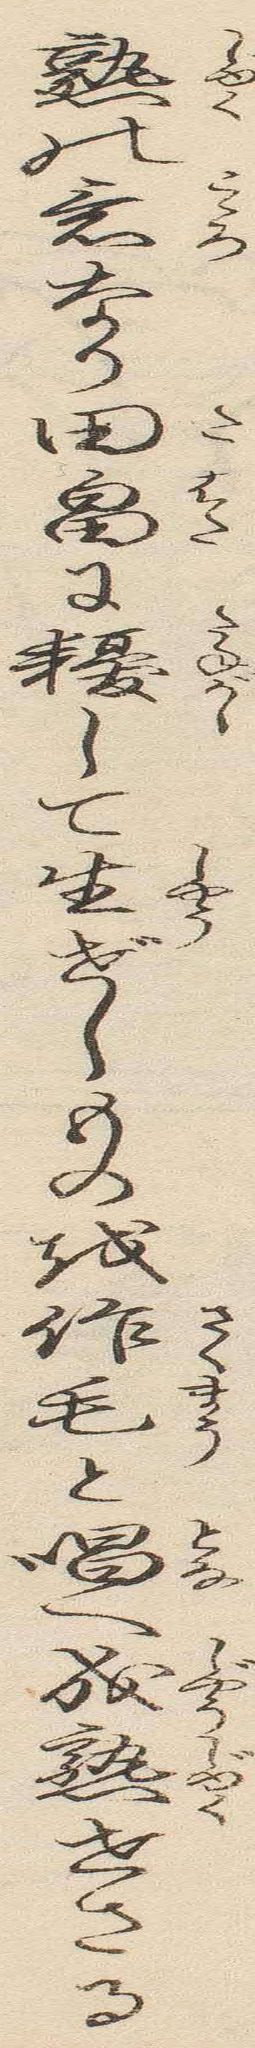熟の意なり田畠に耰して生ぜしものを作毛と唱へ成熟せさる
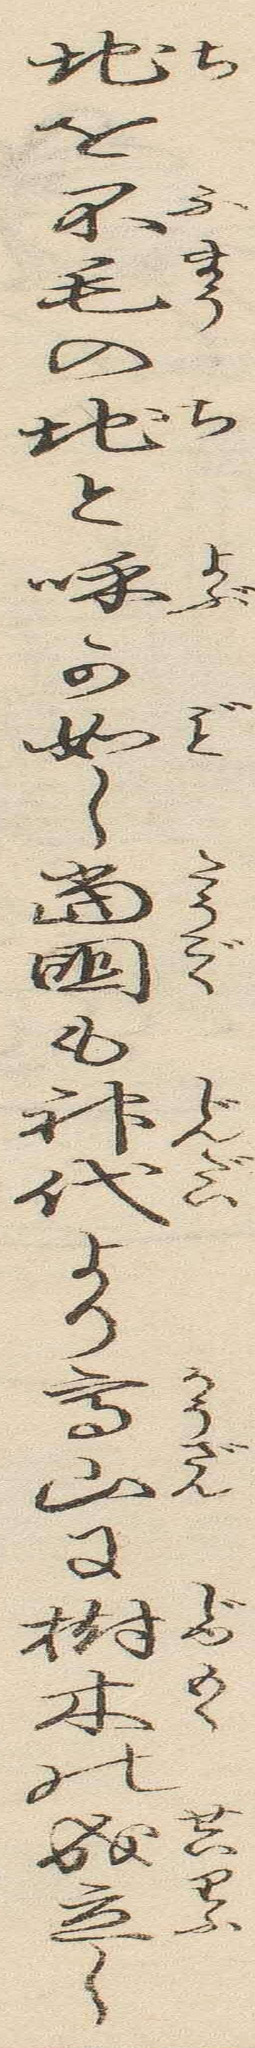地を不毛の地と呼か如し當國も神代より高山に樹木の成立し
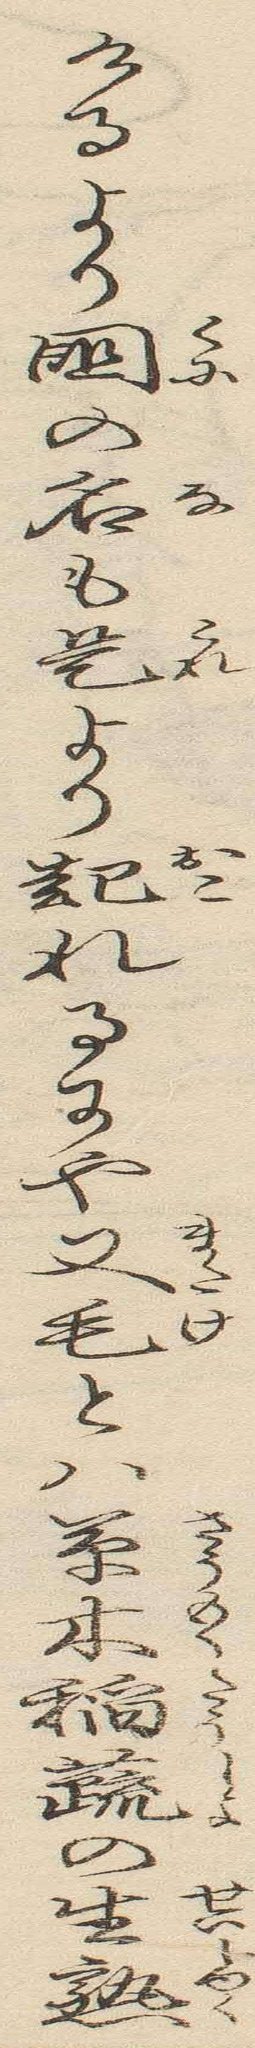けるより國の名も是より起れるにや又毛とは草木稲蔬の生熟
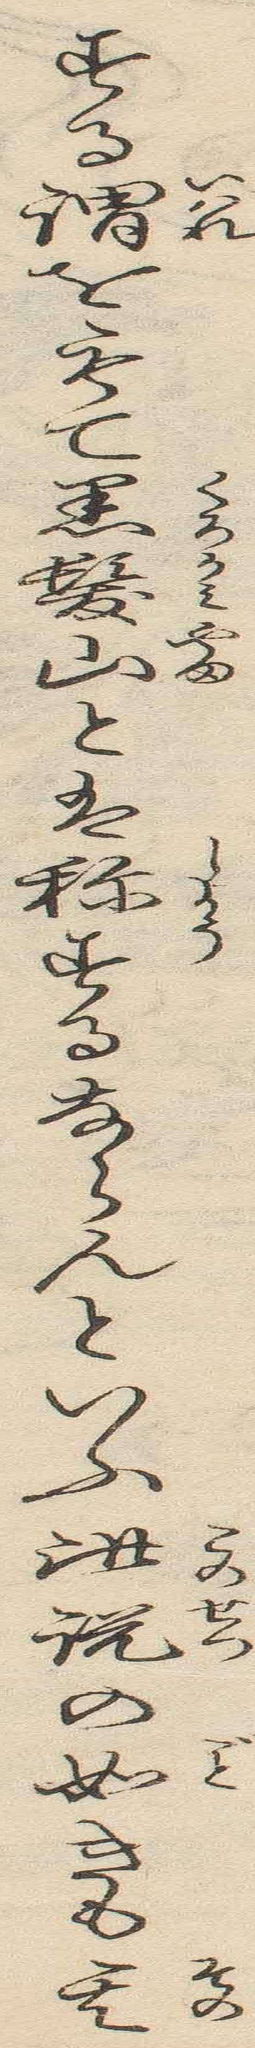する謂をもて黒髪山とは称するならんといふ此説の如きも其
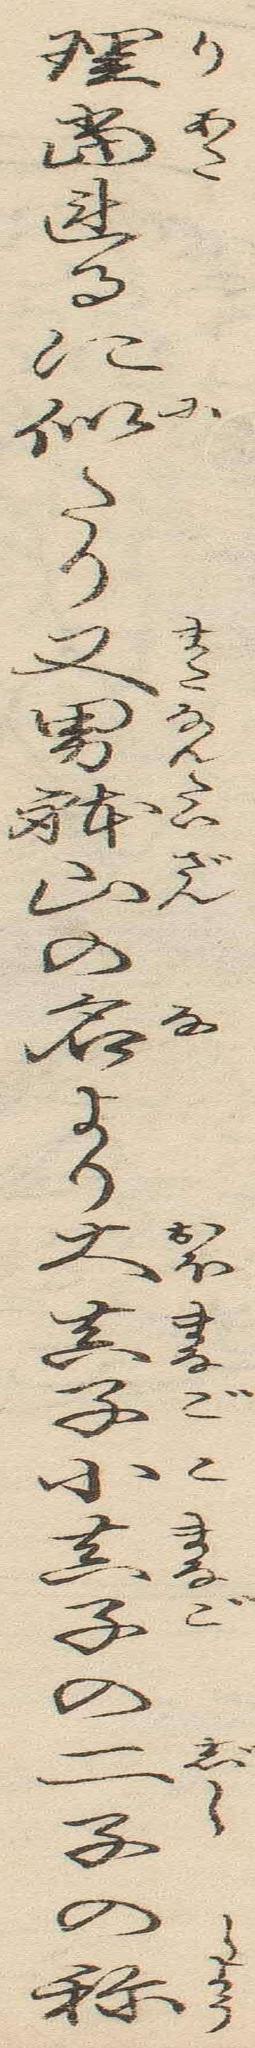理當れるに似たり又男躰山の名より大真子小真子の二子の称
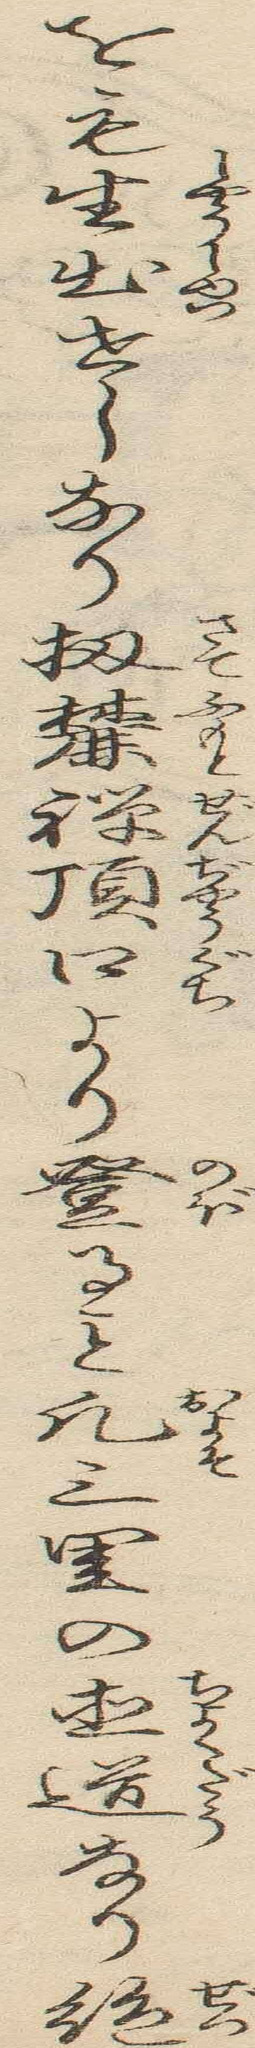をも生出せしなり扨麓禅頂口より登ること凢三里の直道なり絶
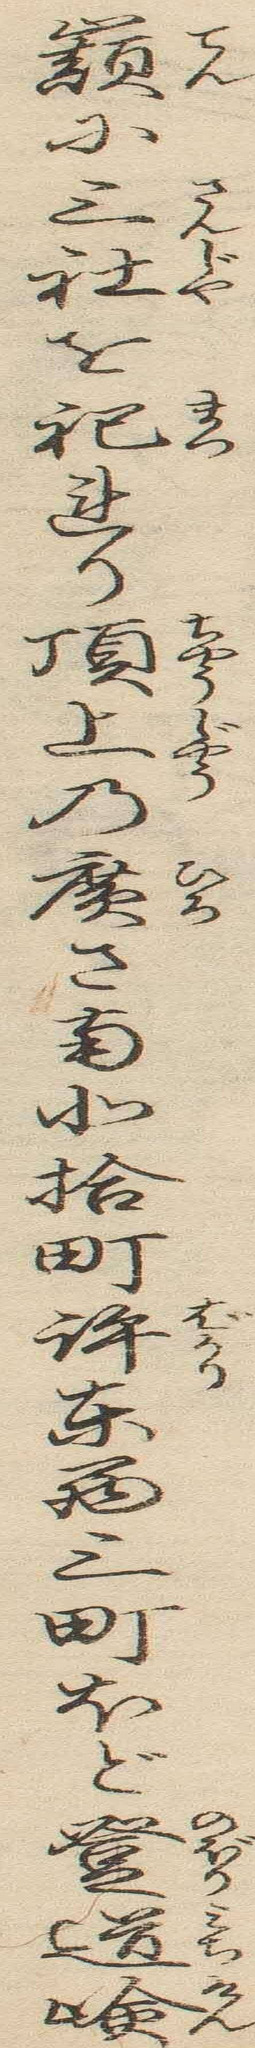巔に三社を祀れり頂上の廣さ南北拾町許東西三町ほど登道𡸴
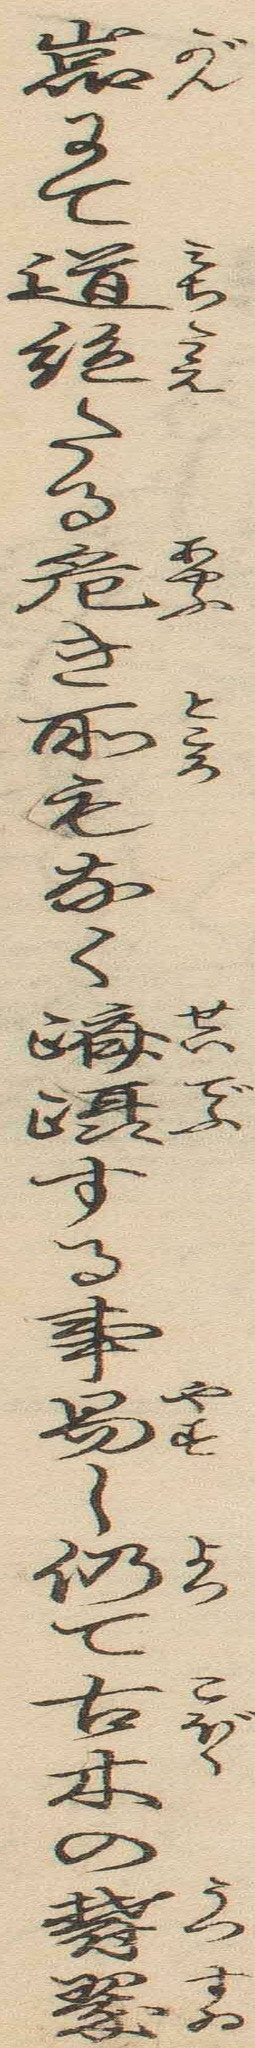嵓にて道絶たる危き所もなく躋躡する事易し仍て古木の欝

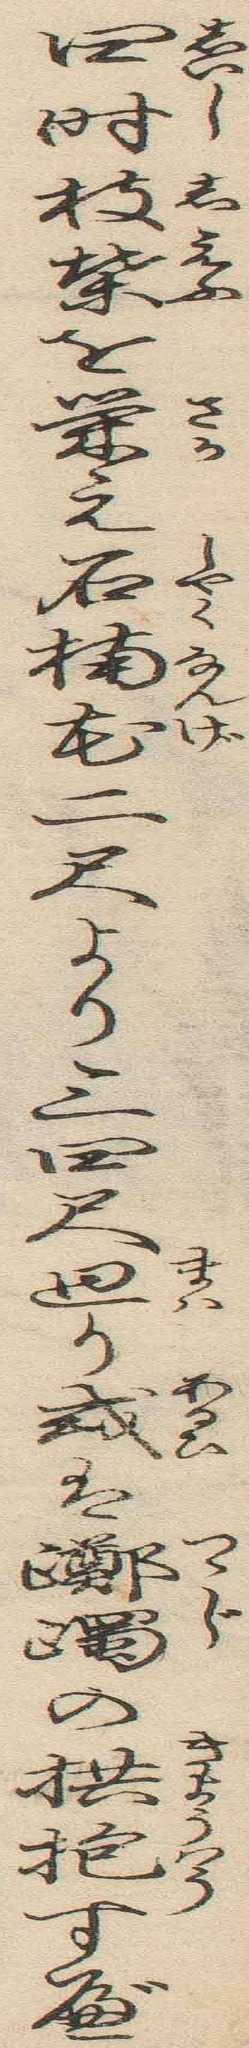四时枝葉を栄え石楠花二尺より三四尺廻り或は躑躅の拱抱すべ
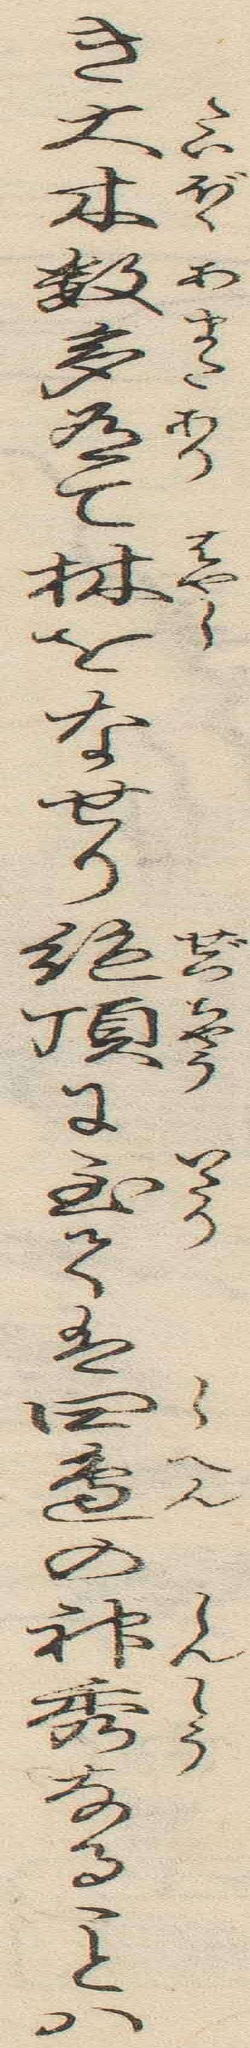き大木数多有て林をなせり絶頂に至ては四邊の神秀なることは
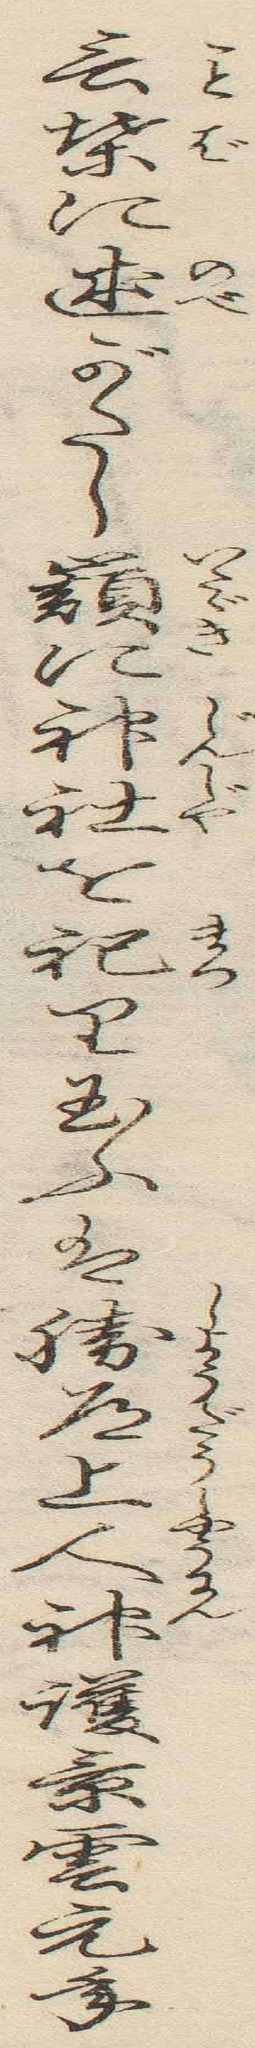言葉に述がたし巔に神社を祀り玉ふは勝道上人神護景雲元年
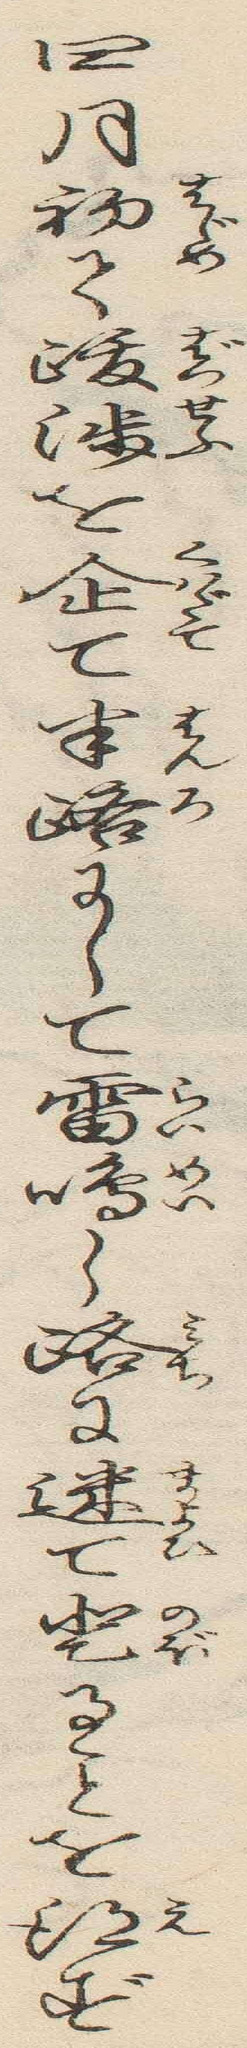四月初て跋渉を企て半路にして雷鳴し路に迷て登ることを得ず
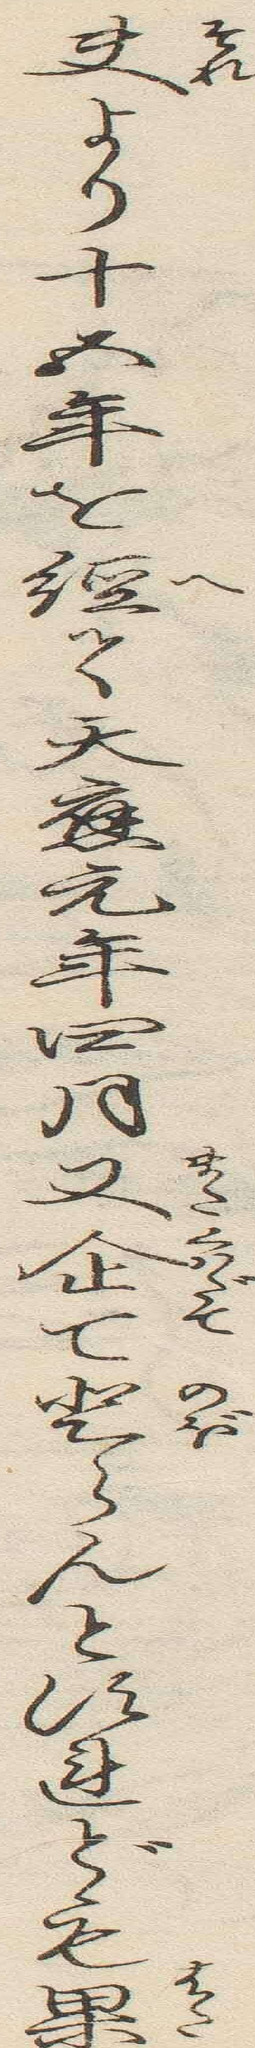夫より十五年を經て天應元年四月又企て登らんとすれども果
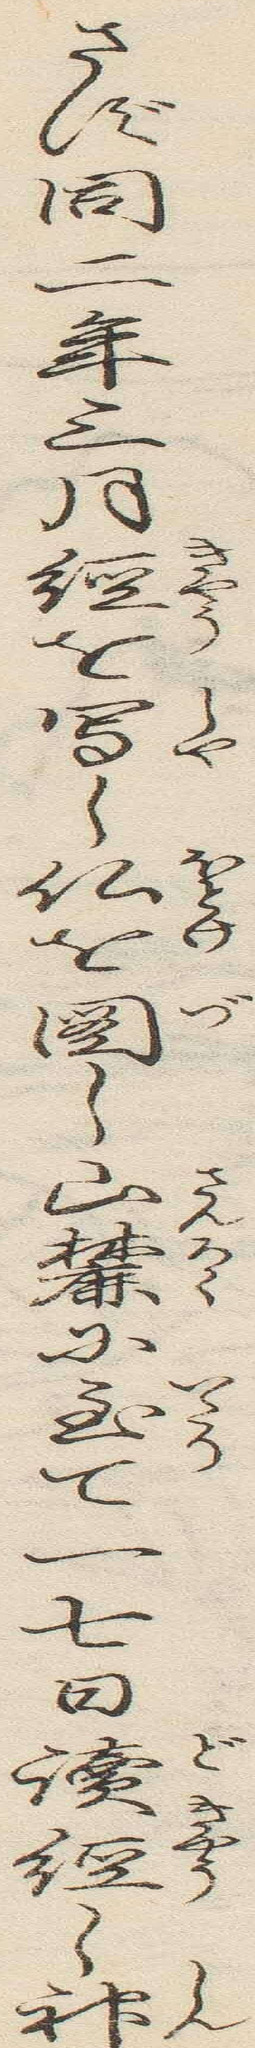さず同二年三月經を写し仏を圖し山麓に至て一七日讀經し神
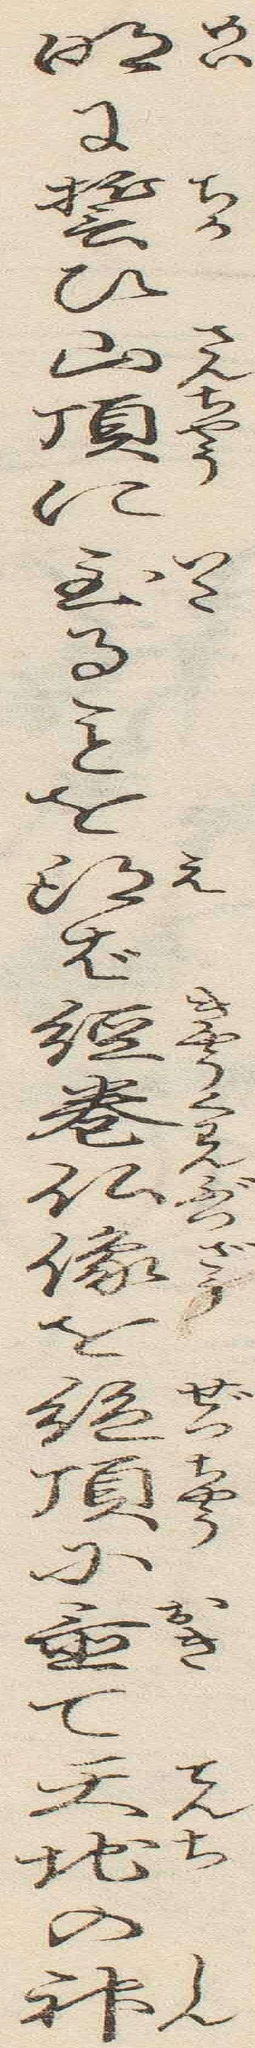明に誓ひ山頂に至ることを得ば經巻仏像を絶頂に置て天地の神
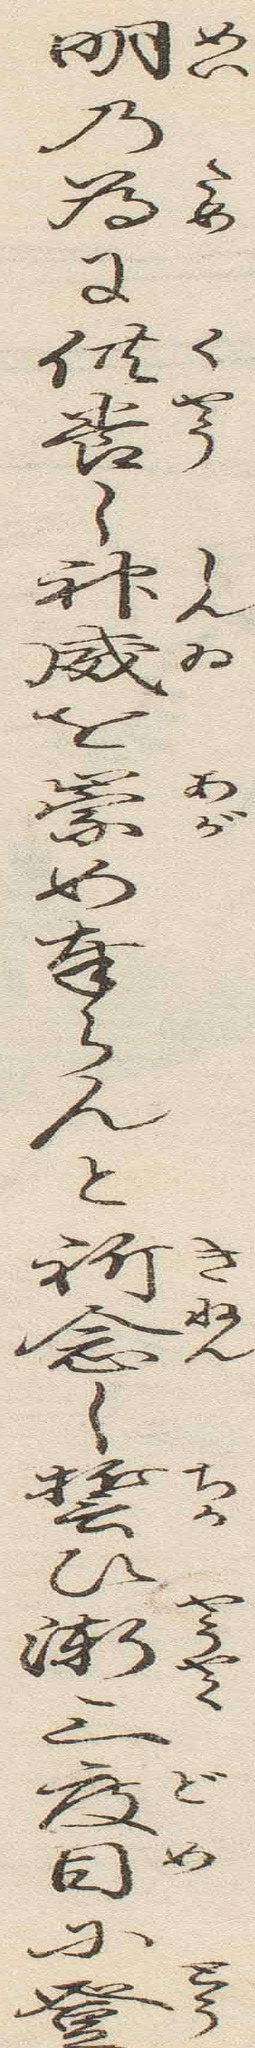明の為に供養し神威を崇め奉らんと祈念し誓ひ漸三度目に登
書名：日光山志
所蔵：東京学芸大学附属図書館 国文学研究資料館
